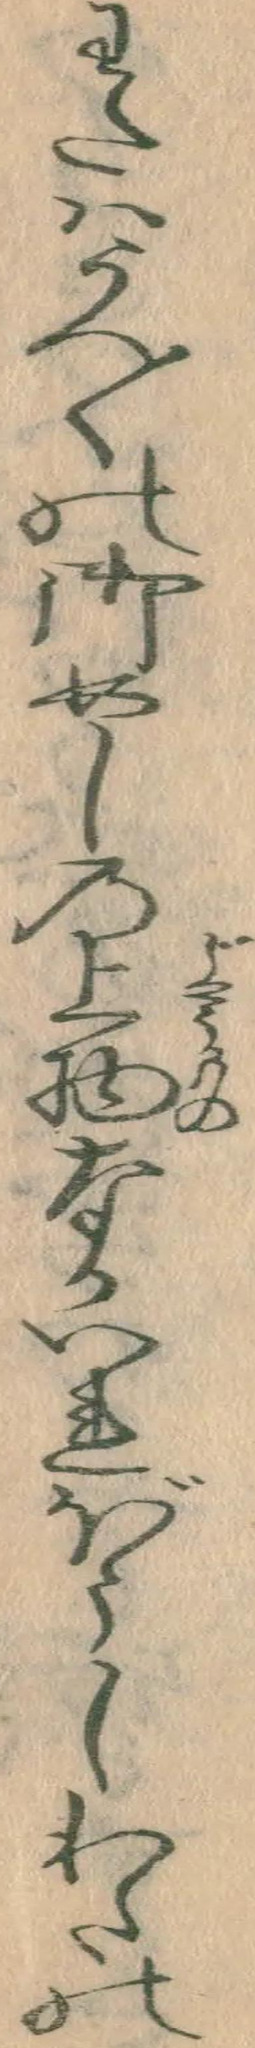わたはうへ〳〵の御めしの上物なかいれぼうしわたの
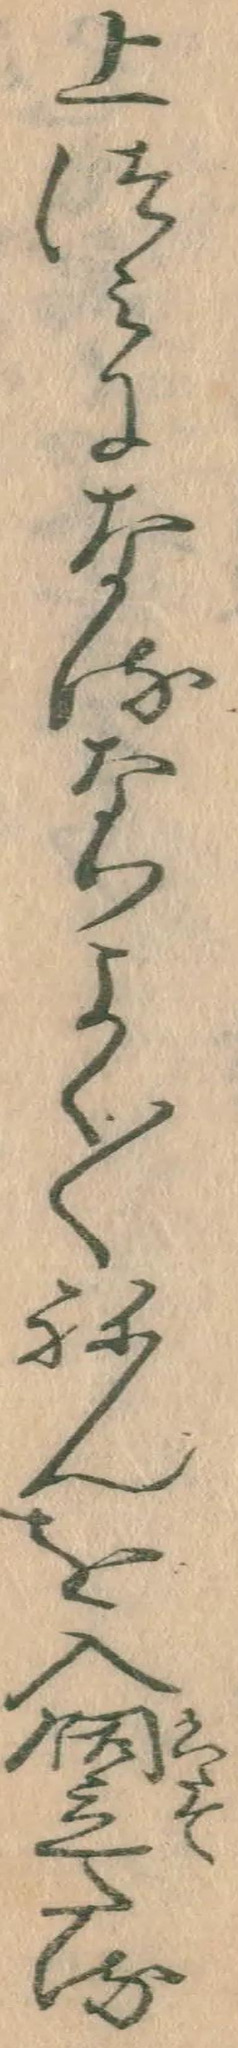上つみになるなりよく〳〵ねんを入飼立たる
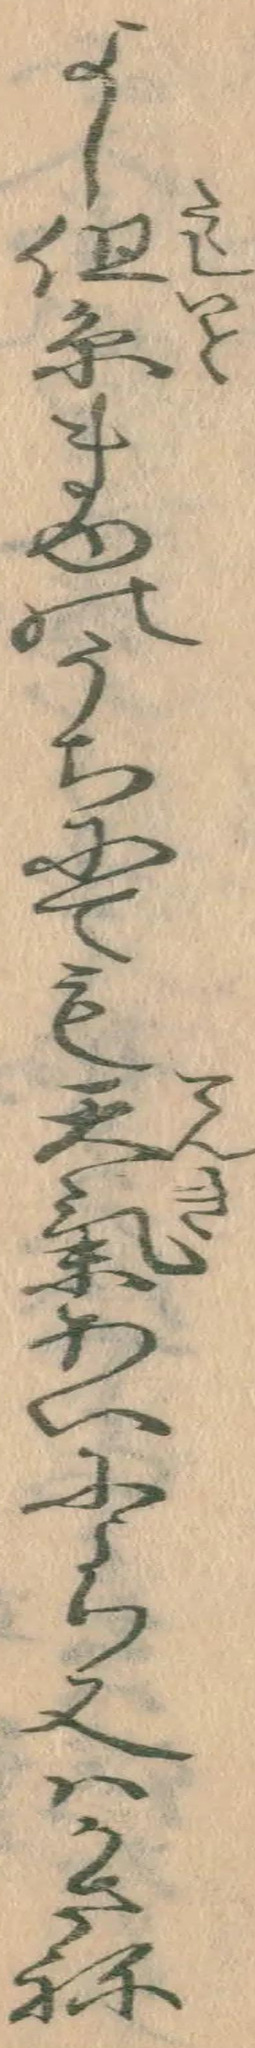よし但糸まゆのうちにても天気あいにより又はかさね
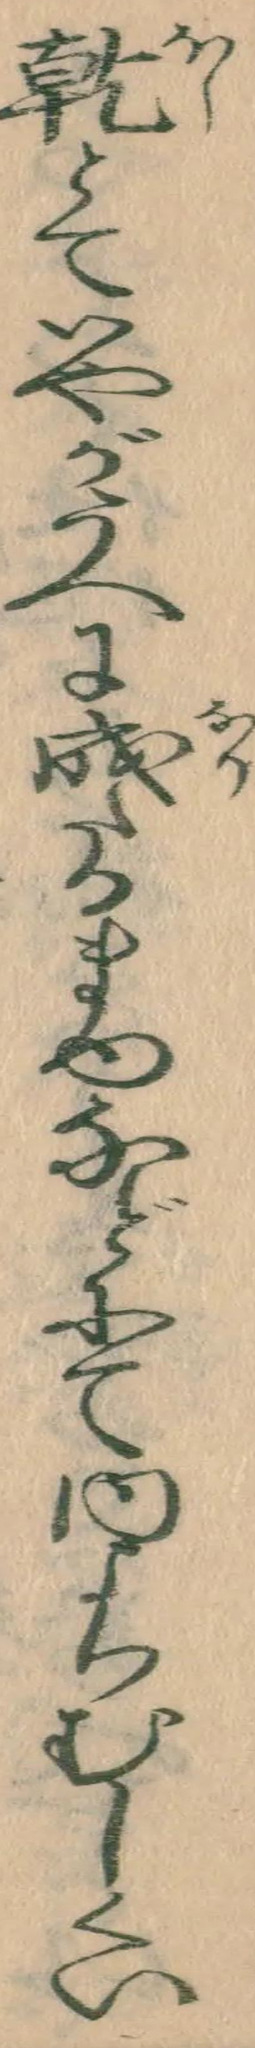乾とていやがうへに成たるまゆなどにて内よりむしくい
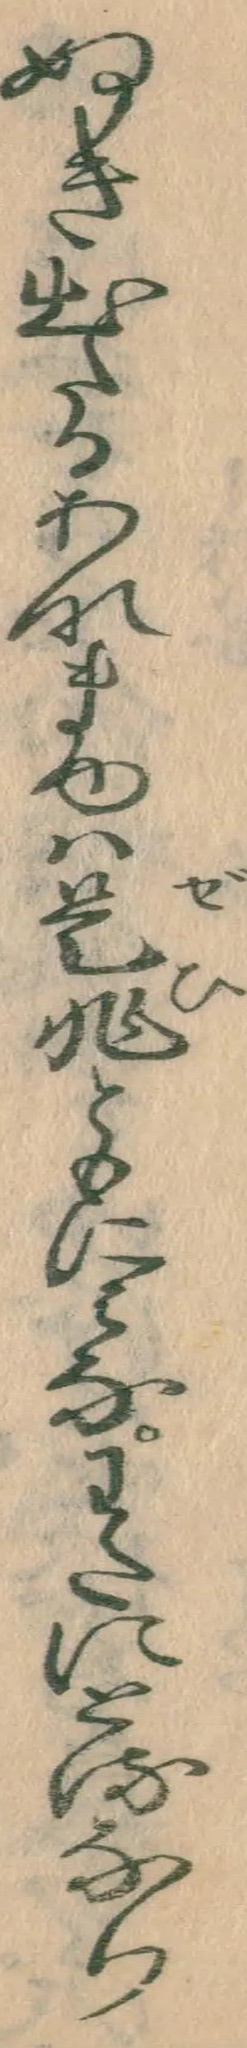ぬき出たるあなまゆは是非ともにみな。わたにとるなり
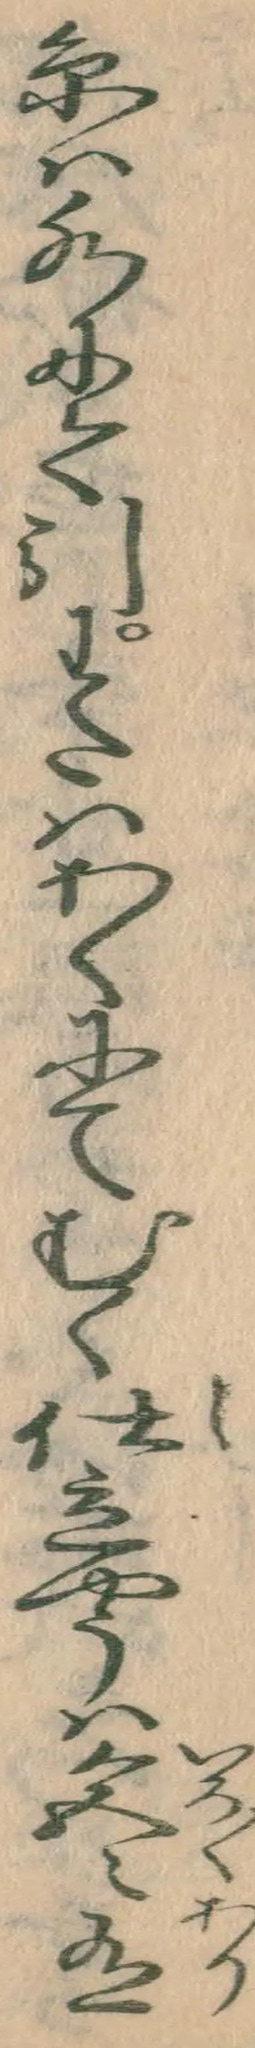糸は水にて引。わたはあくにてむく仕立やうは色々有
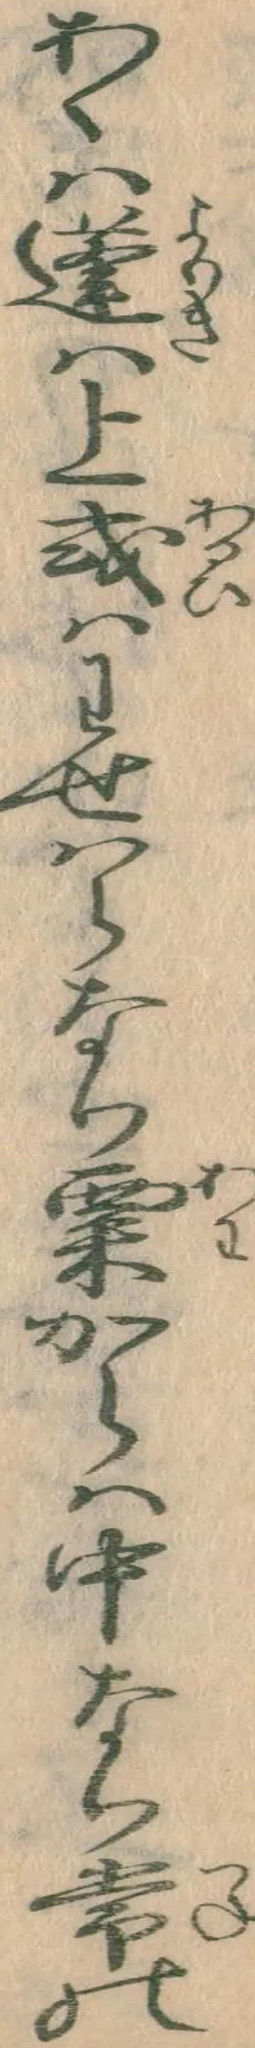あくは蓬は上或はわせはらなり粟からは中なり常の
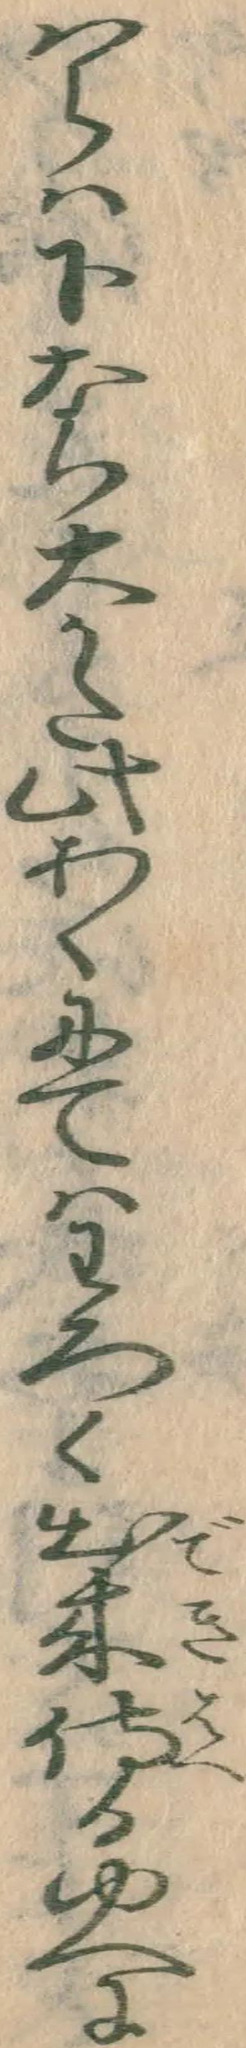はらは下なり大かた此あくにてはわろく出来侍るゆへに
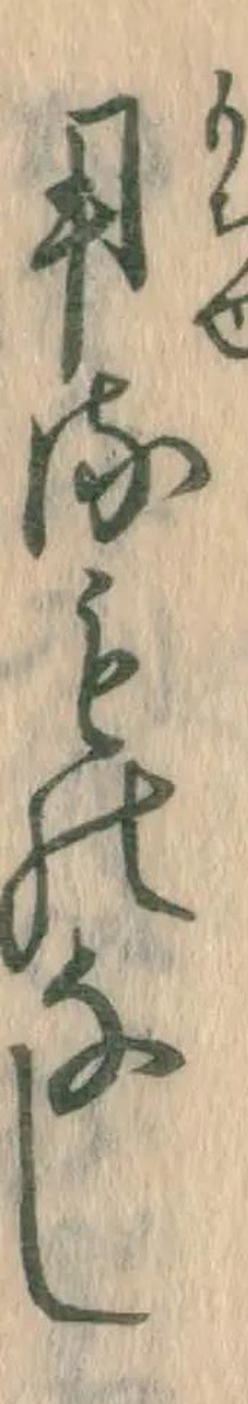用るものなし
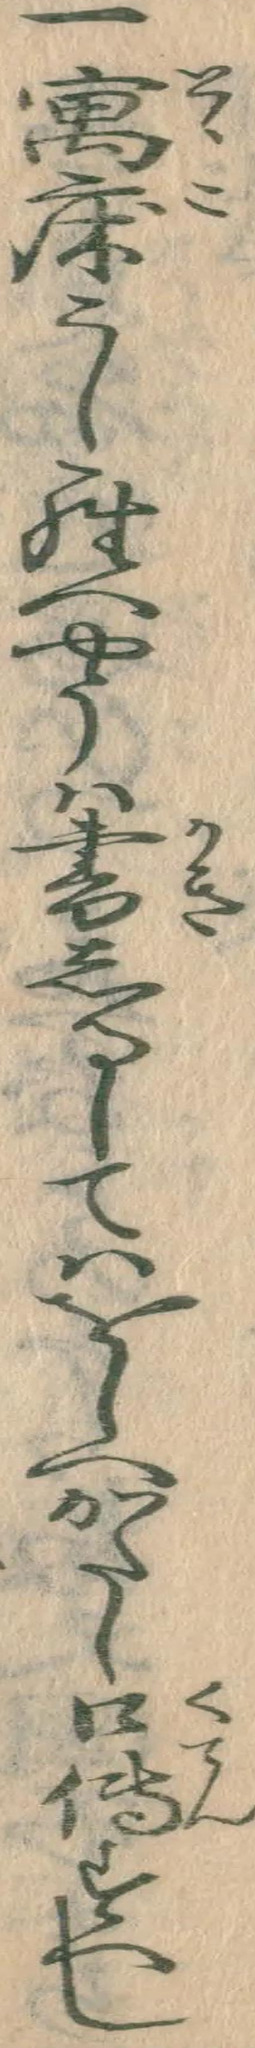一寓床こしらへやうは書しるしてはをしへかたし口伝すへし
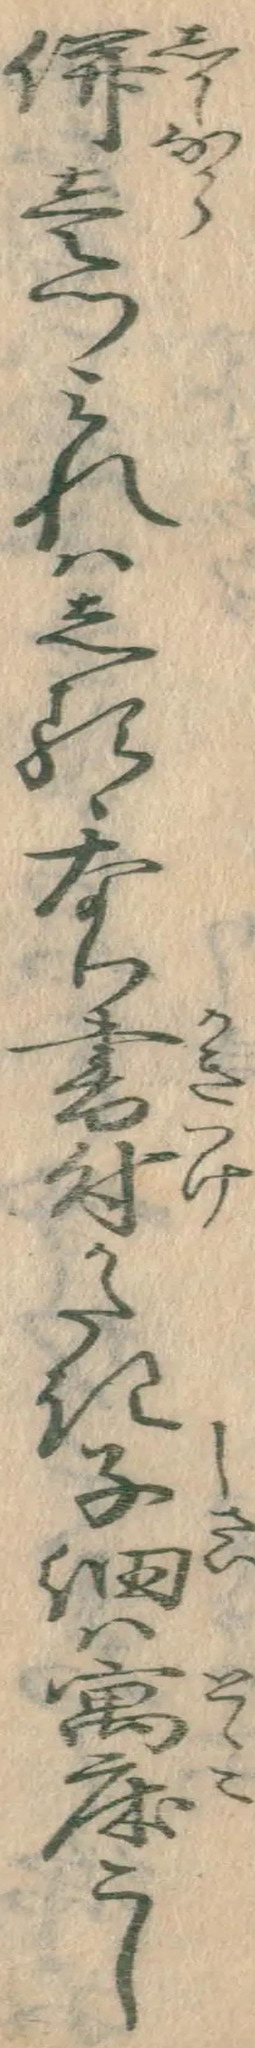併壱つみれはしるゝなり書付かたき子細は寓床こし
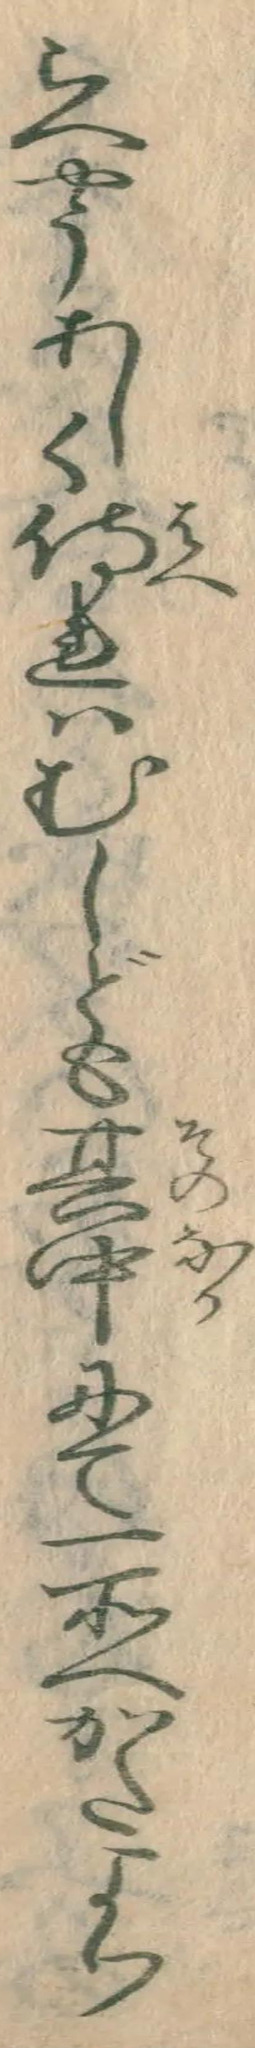らへやうあしく侍れはむしども其中にて一所へかたより
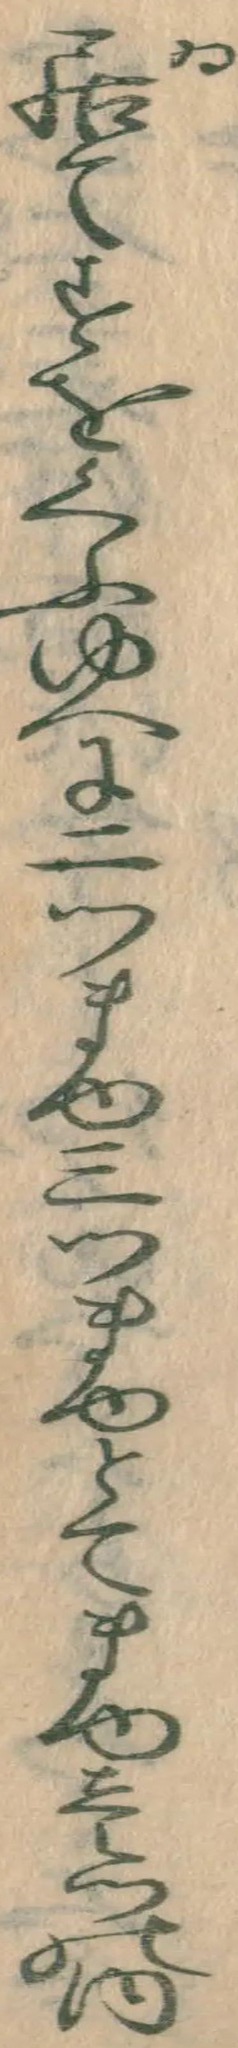居てすをくふゆへに二つまゆ三つまゆとてまゆ壱つの内

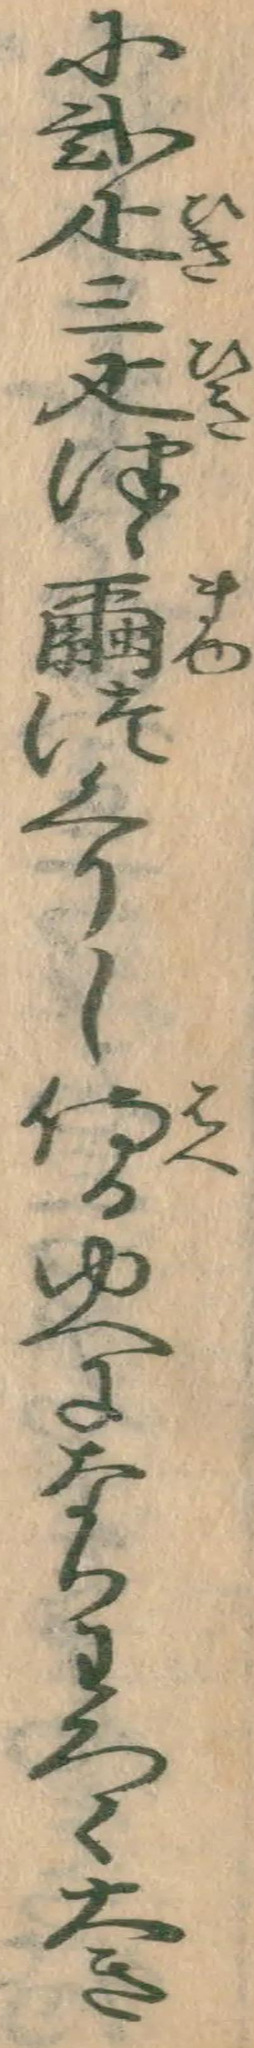に弐疋三疋つゝ爾つくりし侍るゆへになりわろく大き
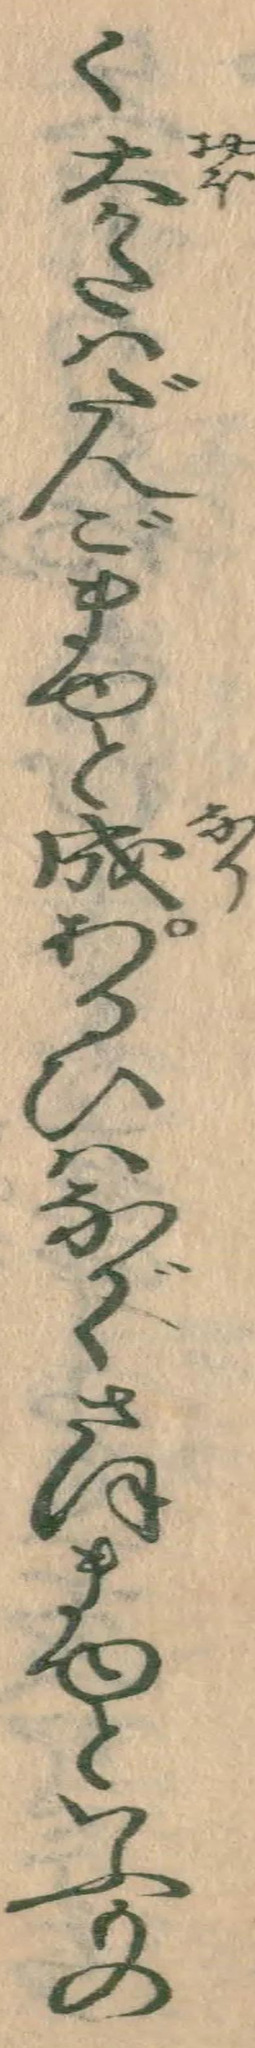く大かたはだんごまゆと成。あるひはながくさほまゆといふもの
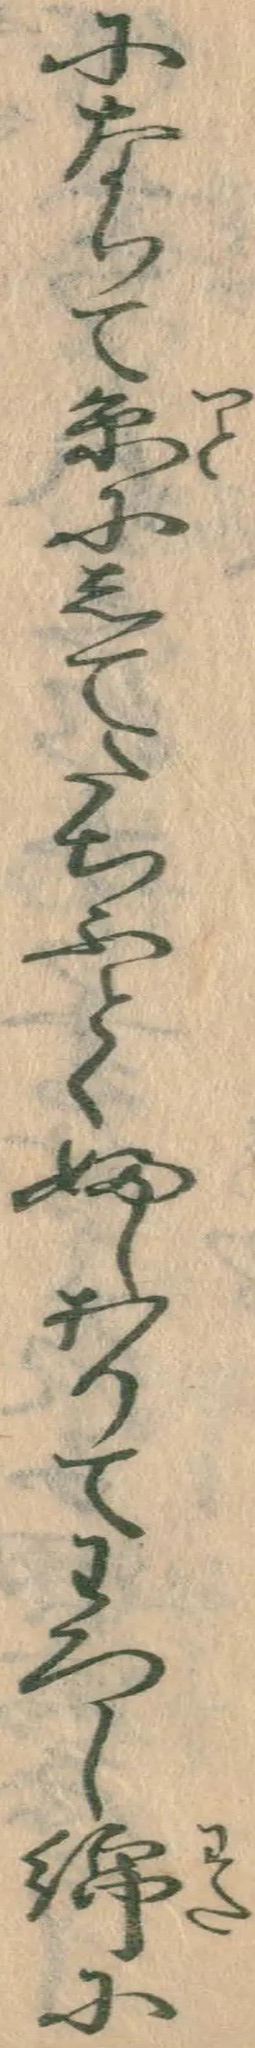になりて糸にしてたちふとくふしありてわろし綿に
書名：蚕飼養法記
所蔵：国立国会図書館 National Diet Library, JAPAN
